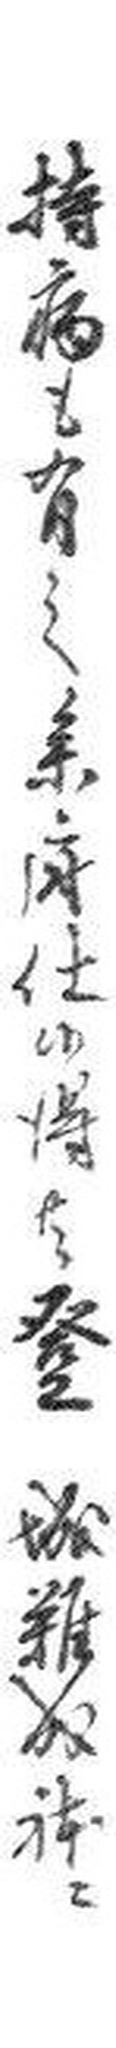持病も有之参府仕候得共登城難成体ニ
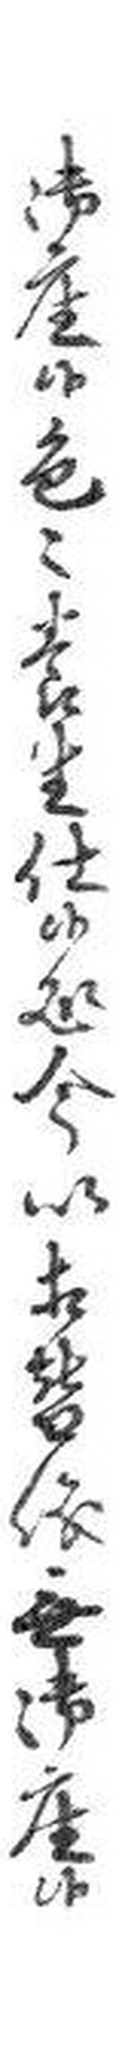御座候色々養生仕候処今以相替儀無御座候
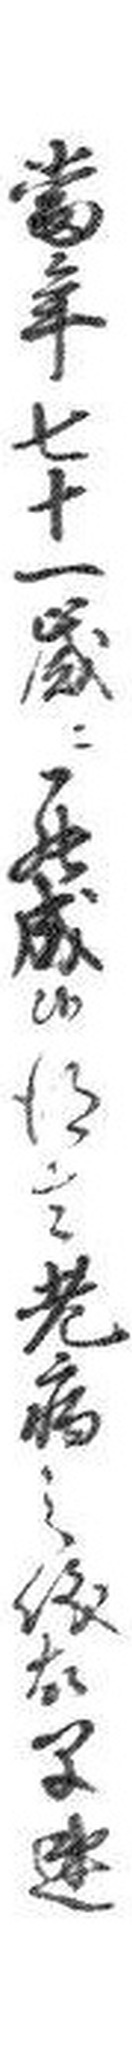当年七十一歳ニ罷成候得は老病之儀故早速
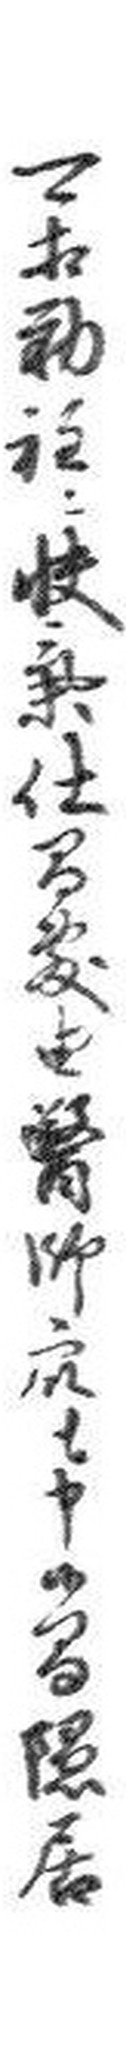可相勤程ニ快気仕間敷由医師衆も申候間隠居
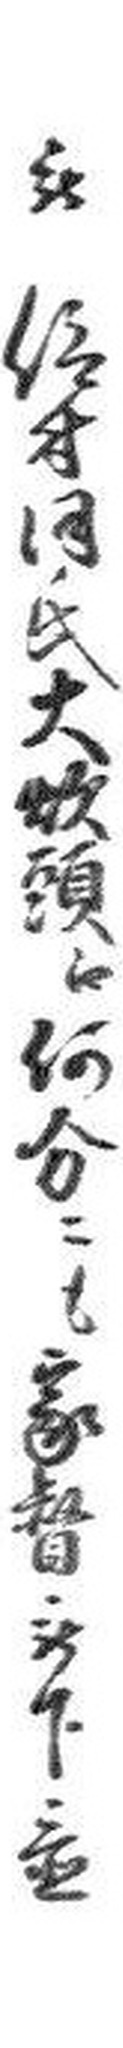被仰付同氏大炊頭江何分ニも家督被下置
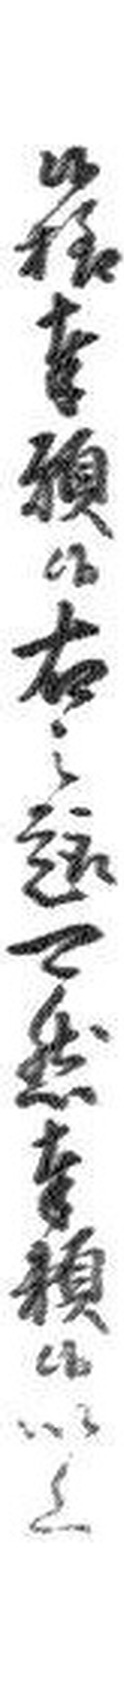候様奉願候右之趣可然奉願候以上
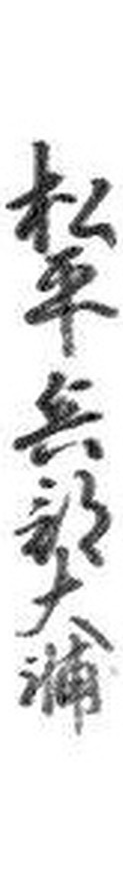松平兵部大輔
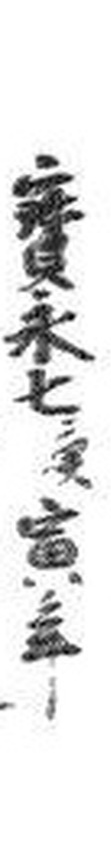宝永七庚寅年
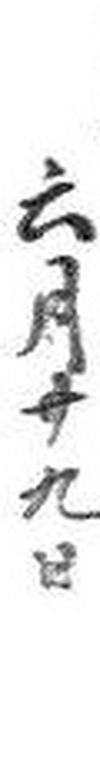六月廿九日
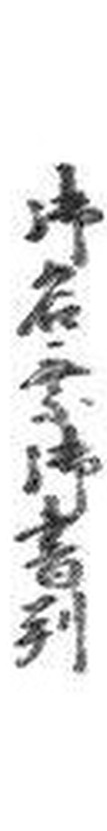御名乗御書判
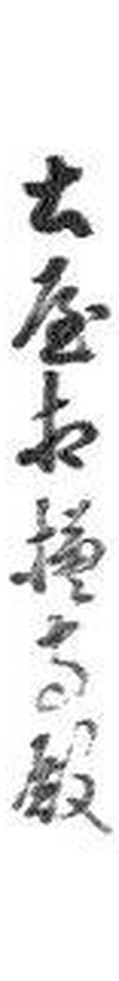土屋相模守殿
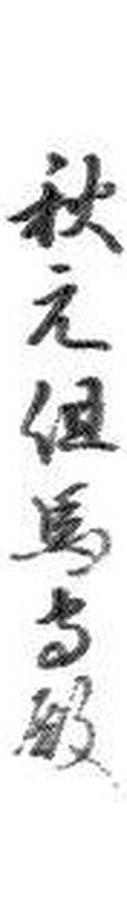秋元但馬守殿
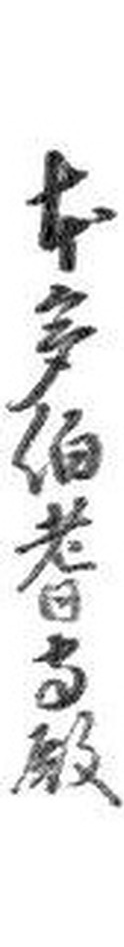本多伯耆守殿
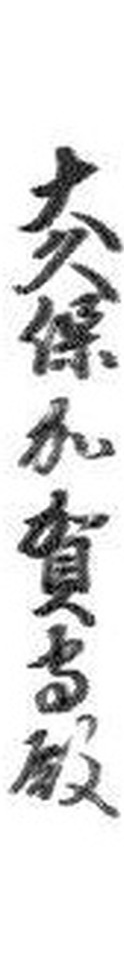大久保加賀守殿

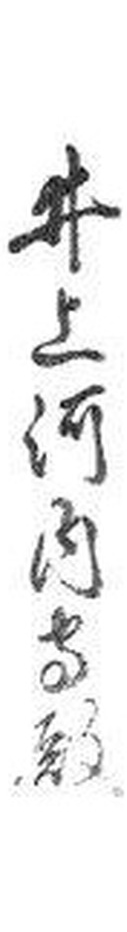井上河内守殿
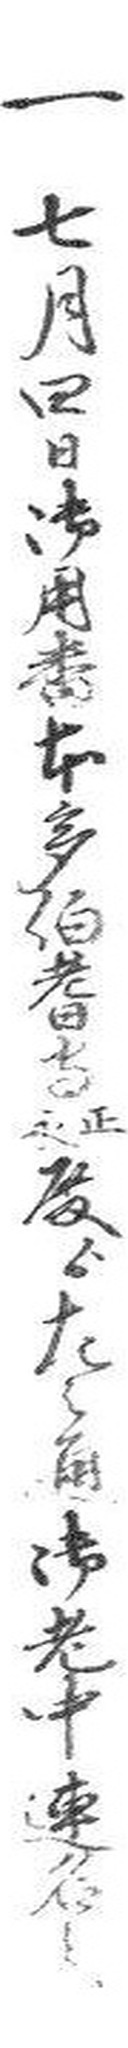一七月四日御用番本多伯耆守正永殿ゟ左之通御老中連名之
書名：家譜 二十五 吉品公 従宝永六年到同七年
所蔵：福井県文書館 Fukui Prefectural Archives
